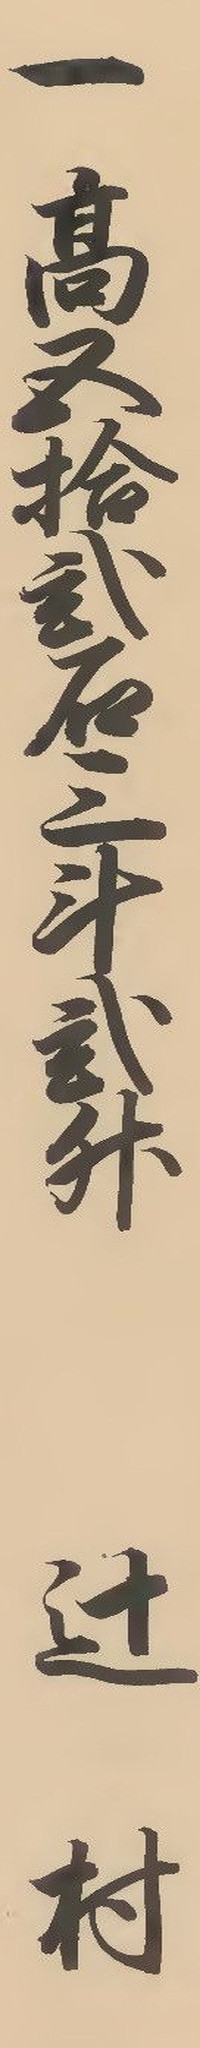一高五拾弐石三斗弐升辻村
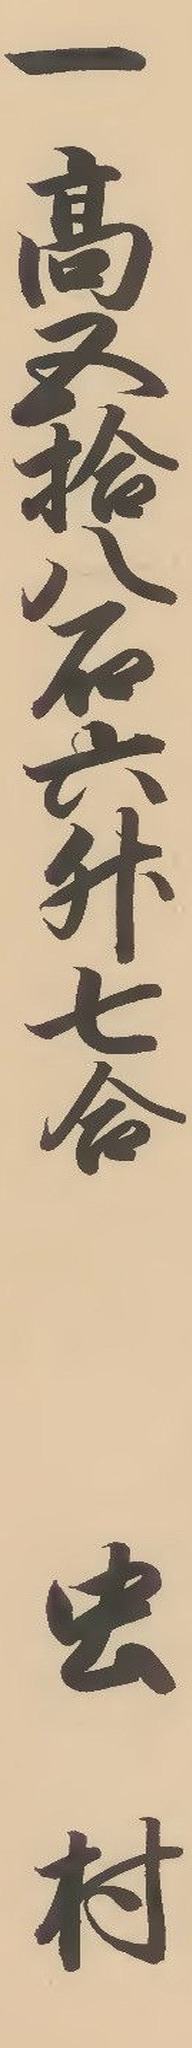一高五拾八石六升七合虫村

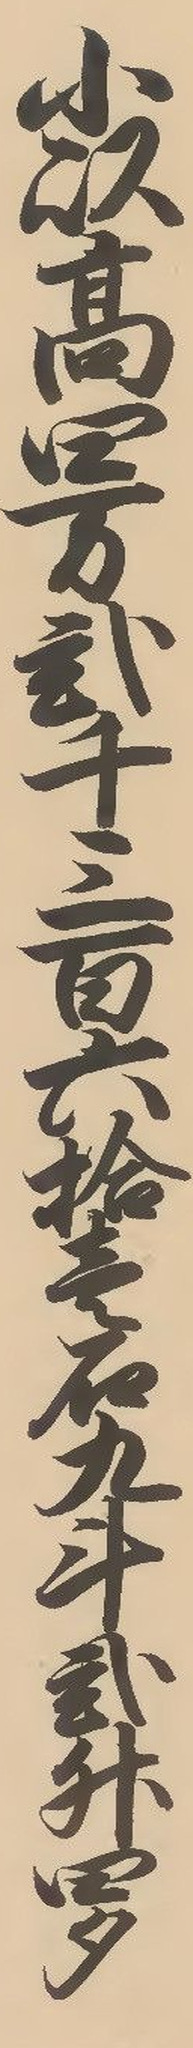小以高四万弐千三百六拾壱石九斗弐升四勺
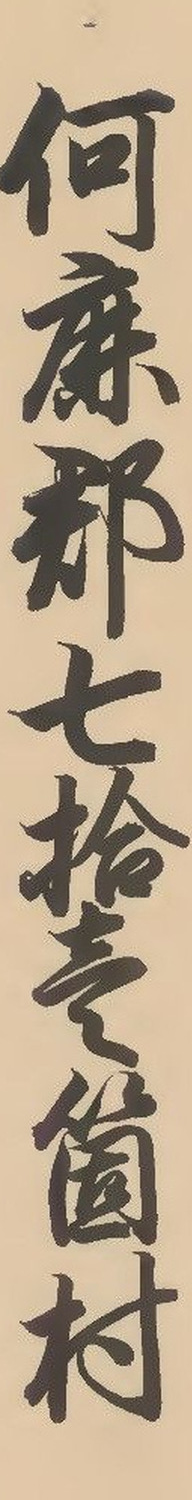何鹿郡七拾壱箇村
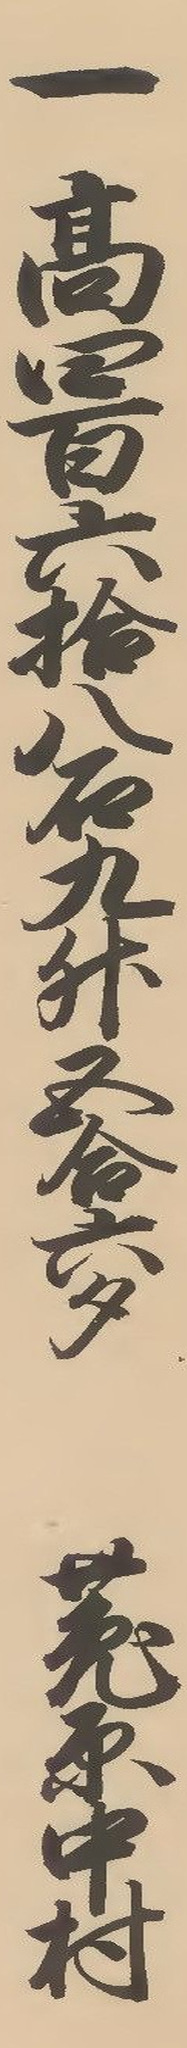一高四百六拾八石九升五合六勺菟原中村
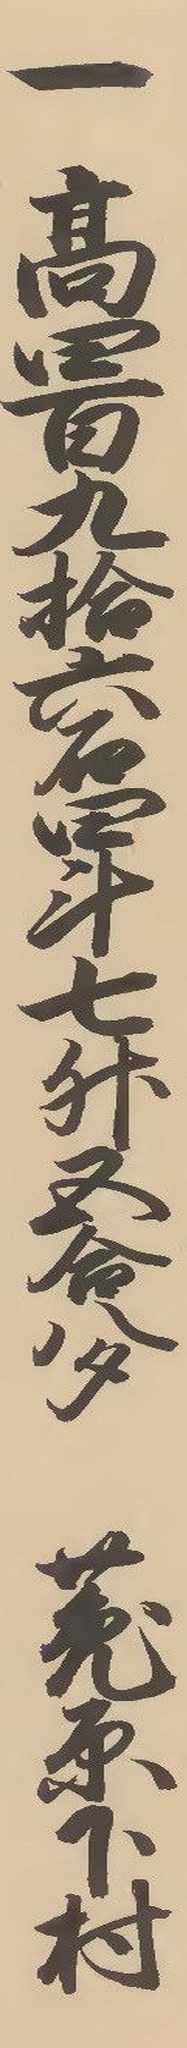一高四百九拾六石四斗七升五合八勺菟原下村
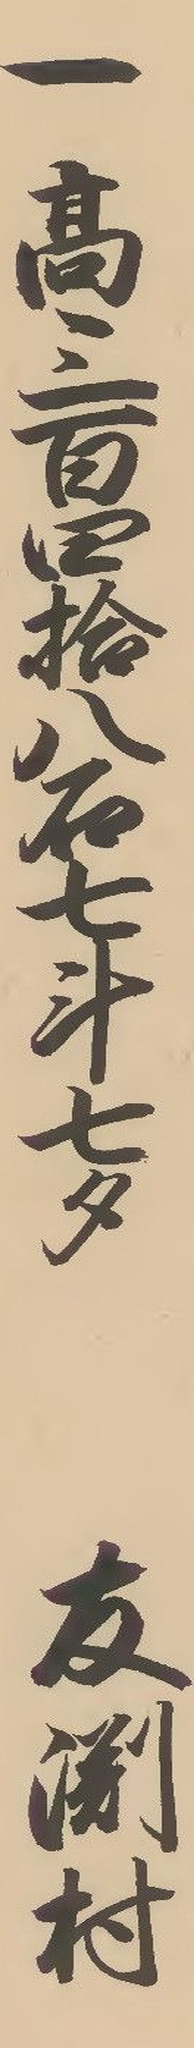一高三百四拾八石七斗七勺友渕村

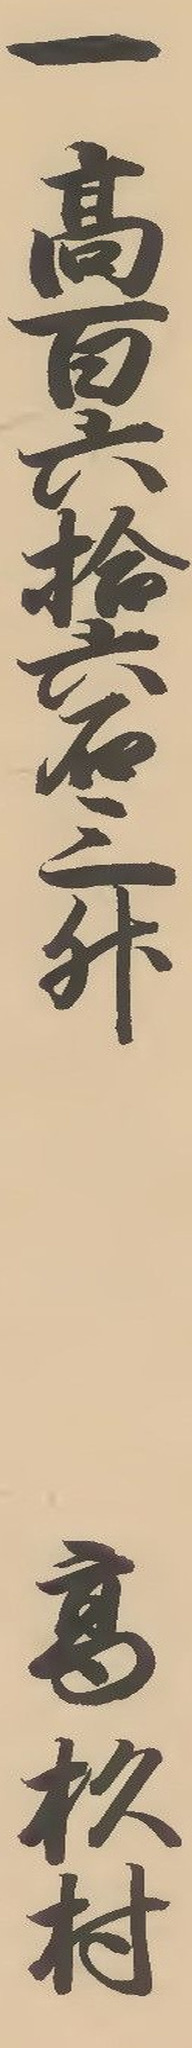一高百六拾六石三升高杉村
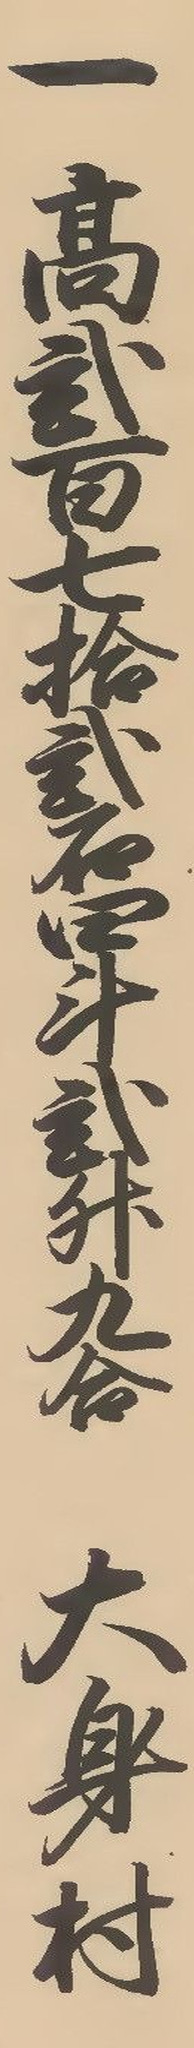一高弐百七拾弐石四斗弐升九合大身村
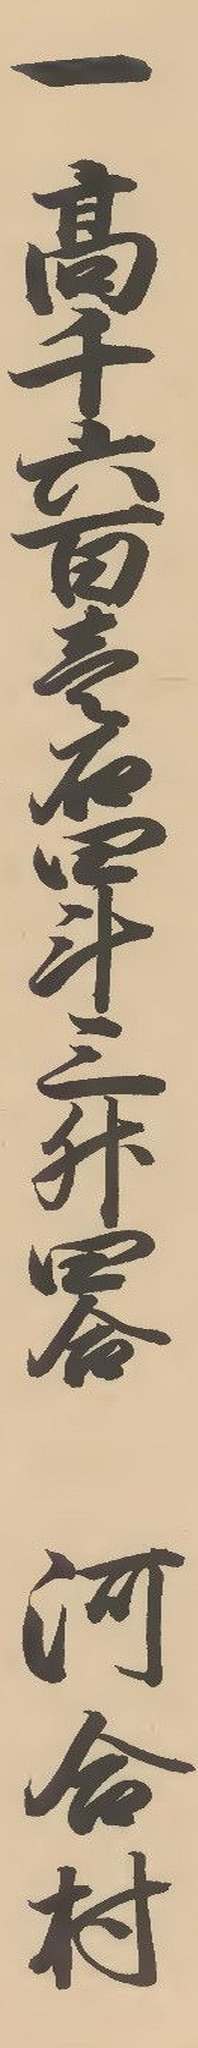一高千六百壱石四斗三升四合河合村
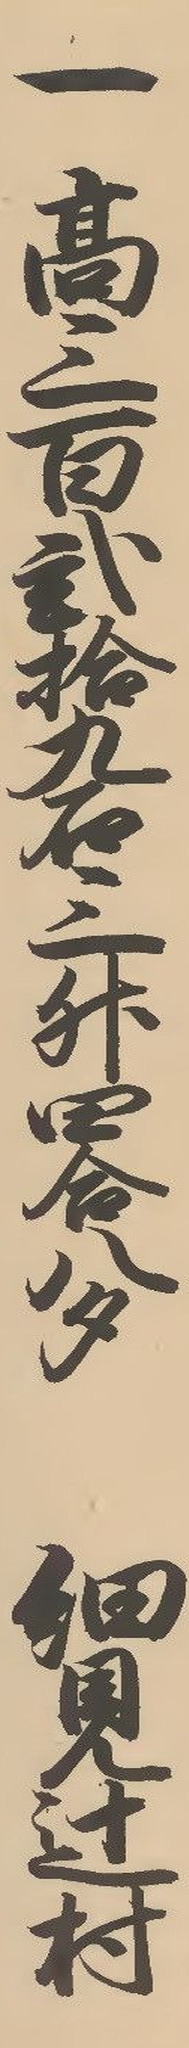一高三百弐拾九石三升四合八勺細見辻村
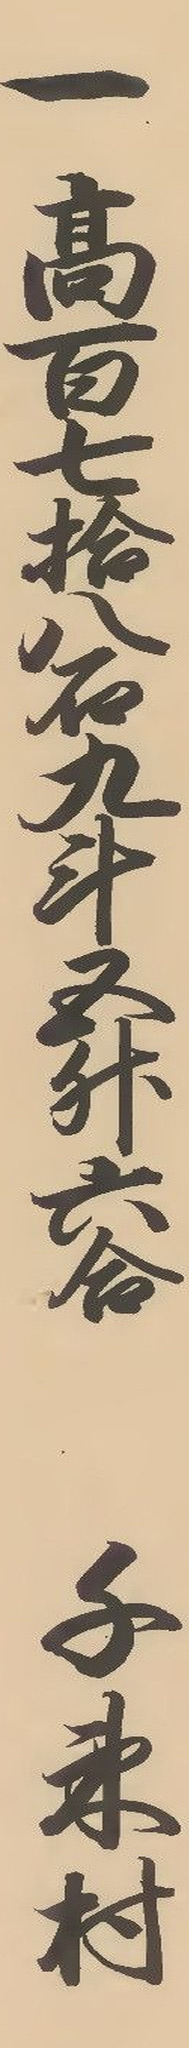一高百七拾八石九斗五升六合千来村
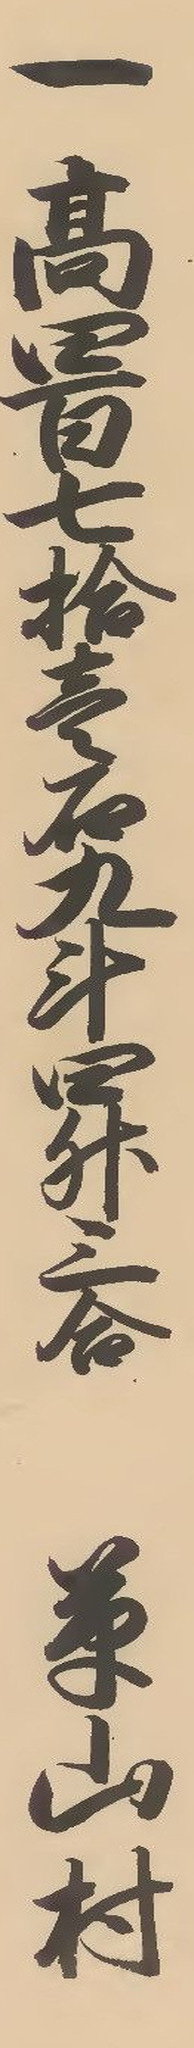一高四百七拾壱石九斗四升三合草山村

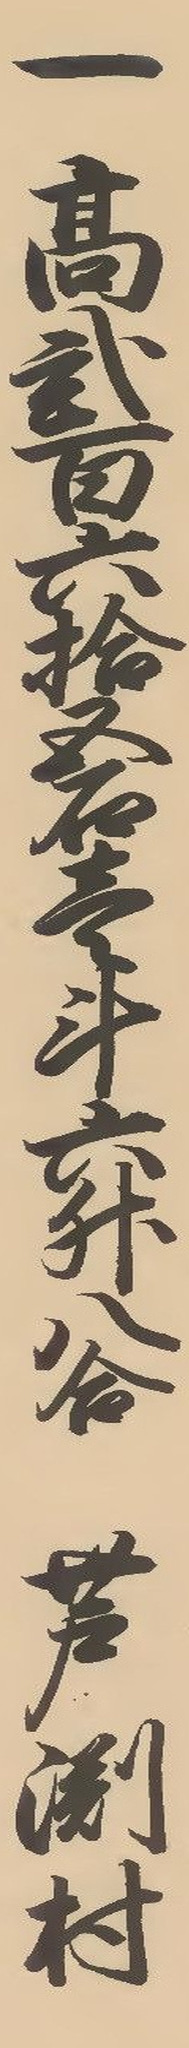一高弐百六拾五石壱斗六升八合芦渕村
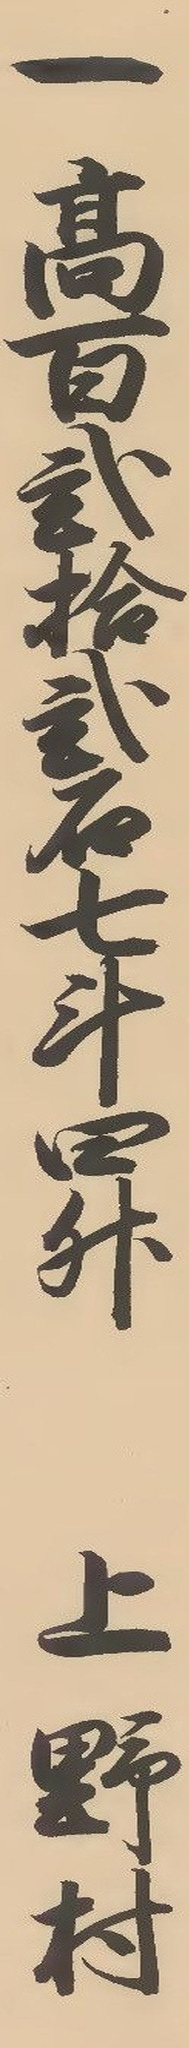一高百弐拾弐石七斗四升上野村
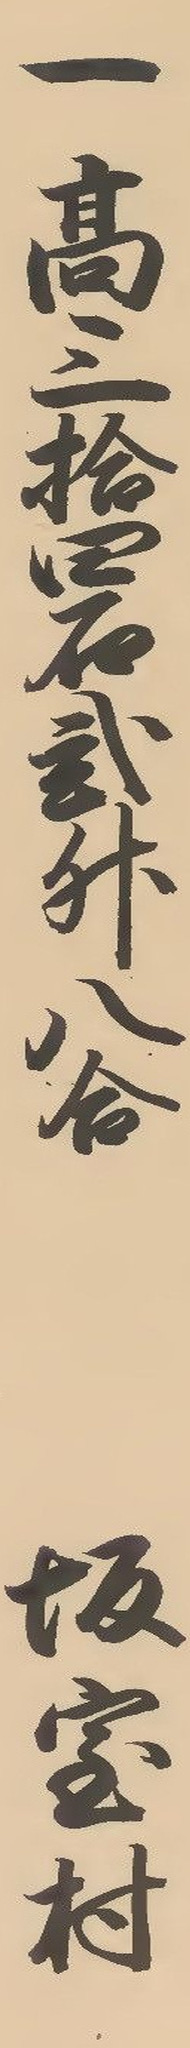一高三拾四石弐升八合坂室村
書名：丹波国郷帳
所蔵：国立公文書館 National Archives of Japan
